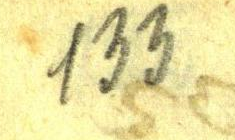133
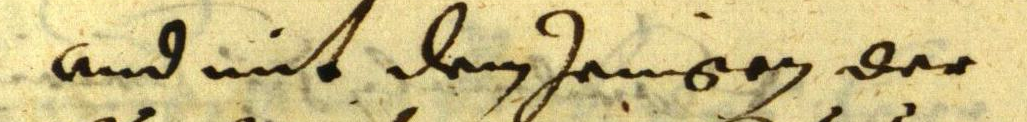vnd mit dem Jenigen der
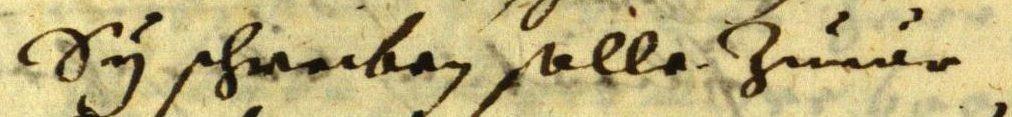Sȳ schreiben solle. Zūūor
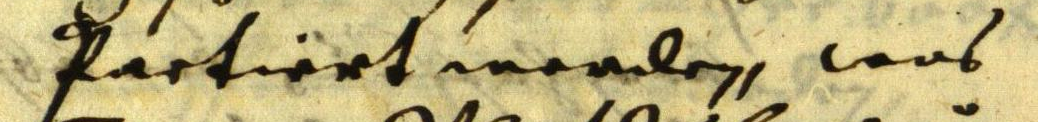Pactiert werden, was
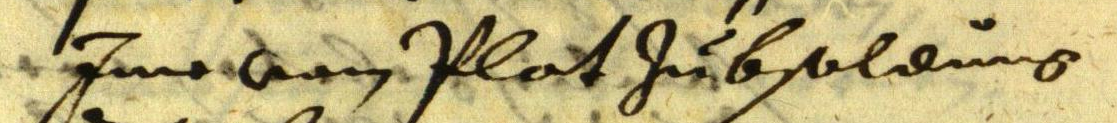Ime vom Plat Zū bsoldūng
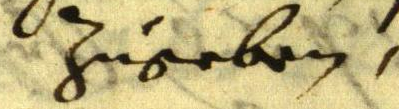Zūgeben,
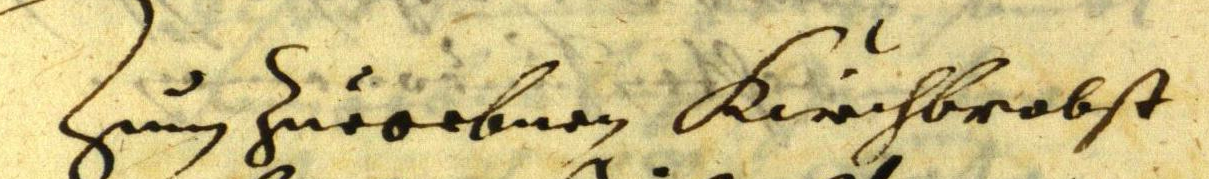Zūm Zūegebnen Kirchbrobst
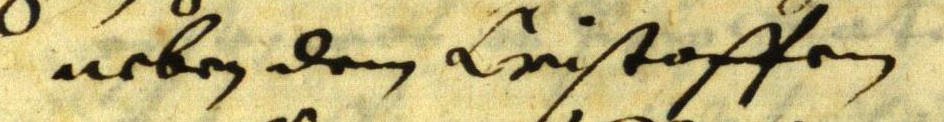neben dem Cristoffen
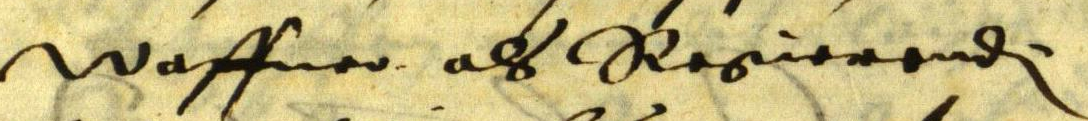Waffner. als Regierend.
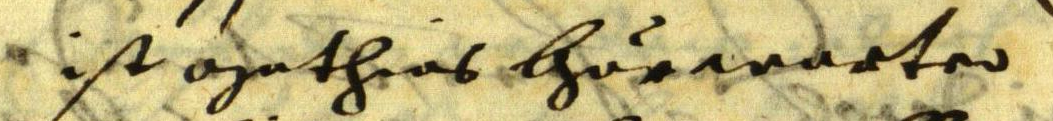ist Mathias Hōrwarter
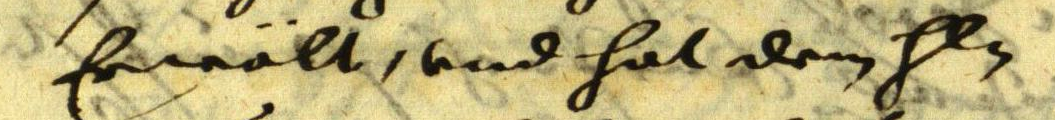Erwölt, vnd hat dem hln
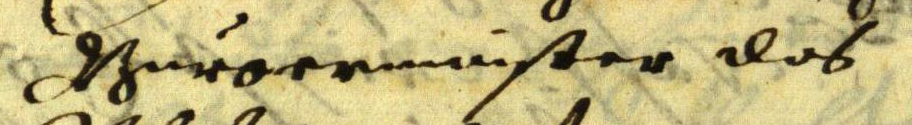Būrgermaister das
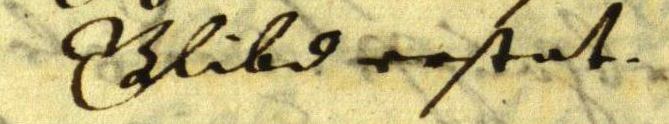Glibd erstat.
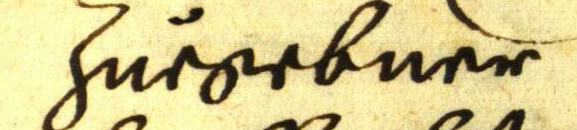Zūegebner
